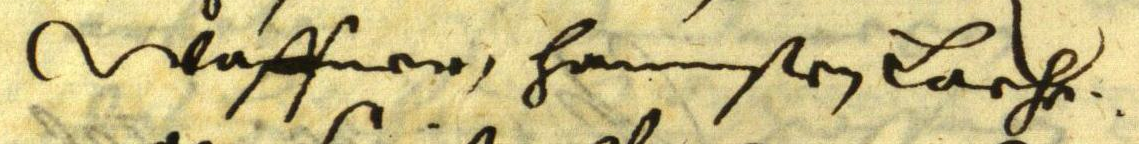Waffner, hannsen Loche¬
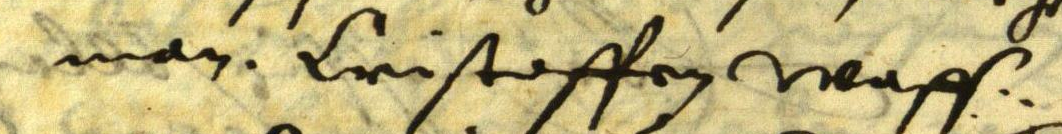man. Cristoffen Waff¬
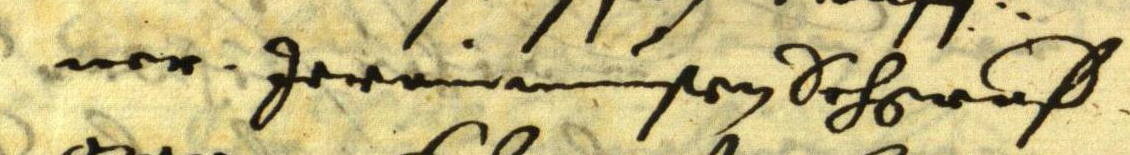ner. Jeronimūsen Schgraf.
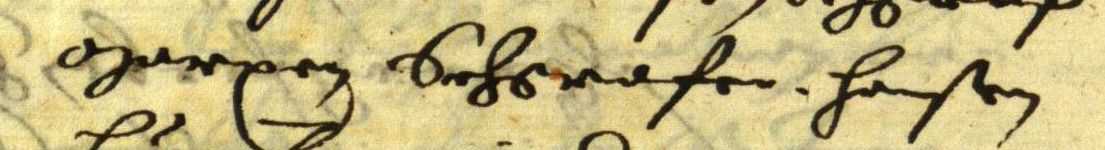Marxen Schgrafer. hansen
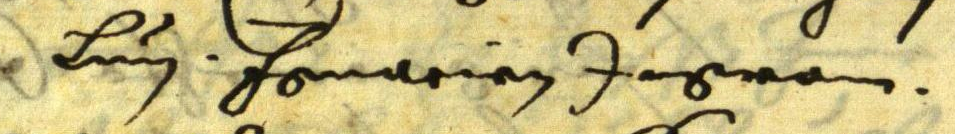Lūn. Ignacien Ingram.
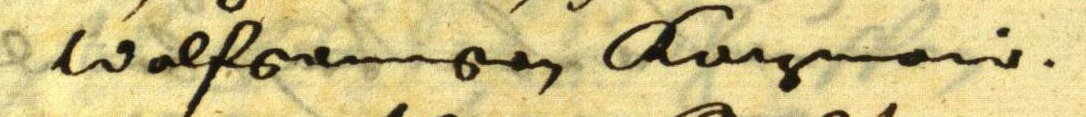Wolfganngen Kazmair.
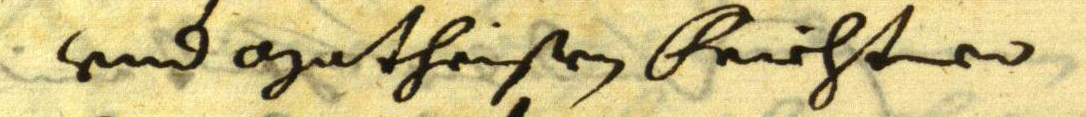vnd Matheisen Feichtner
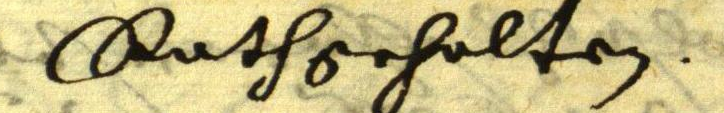Rath gehalten.
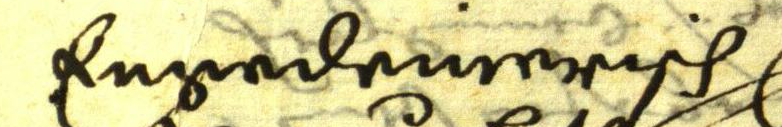Engedeinerisch
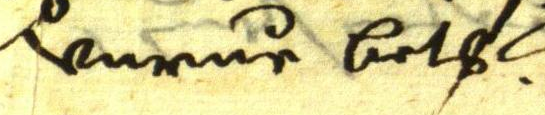vnrūe bet:
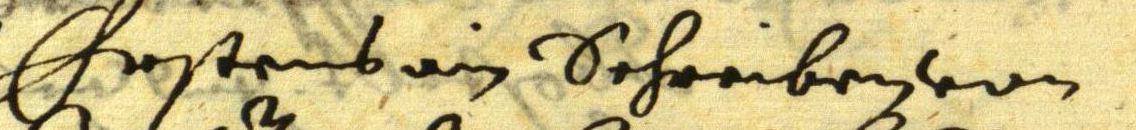Erstens ain Schreiben von
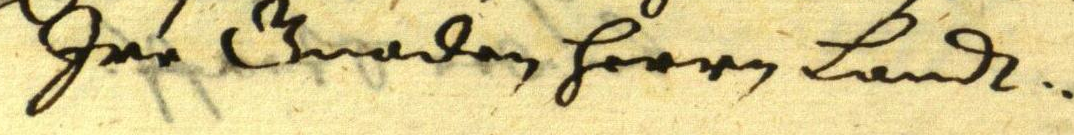Ire Gnaden herrn Landt¬
